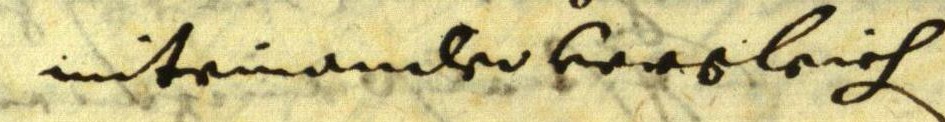miteinander vergleich.
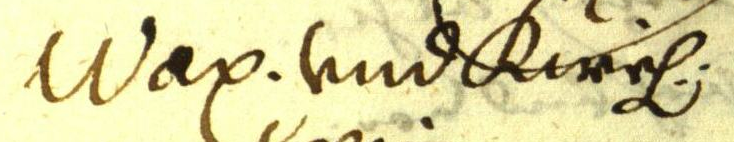Wax. vnd Kirch¬
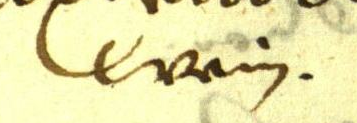wein.
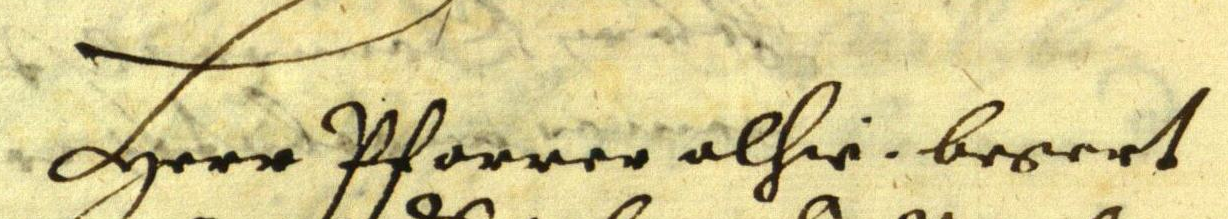Herr Pfarrer alhie begert
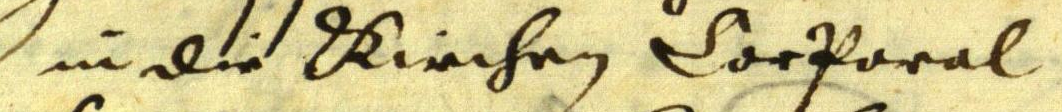in die Kirchen CorPoral
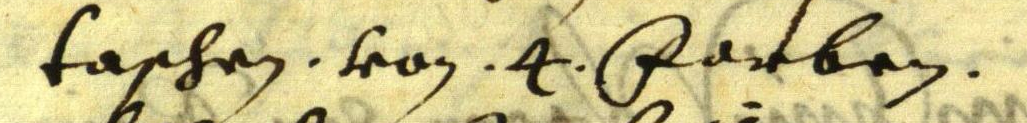taschen. von .4. Farben.
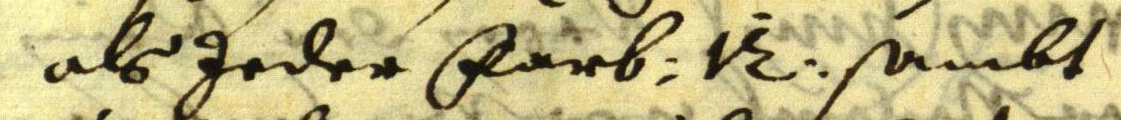als Jeder Farb: 12: sambt
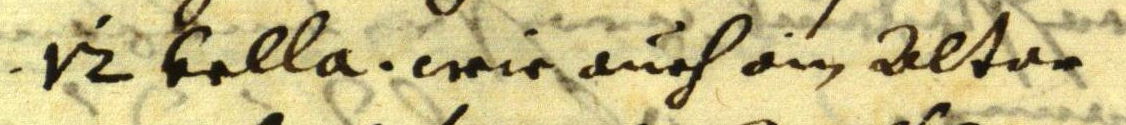12 vella. wie aūch ain Altar
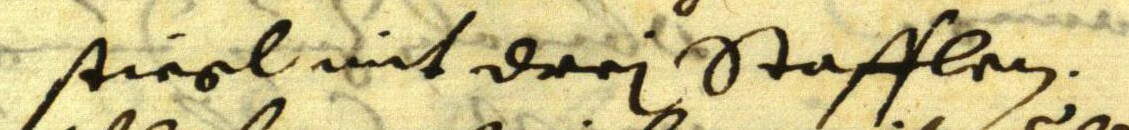stiegl mit drej Stafflen.
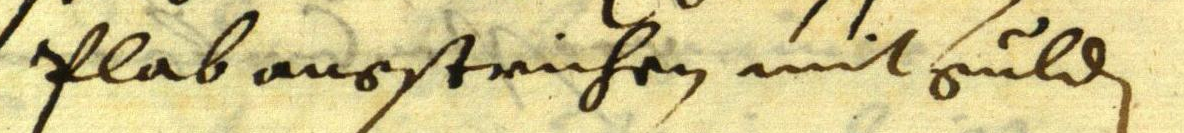Plab angstrichen mit gūld
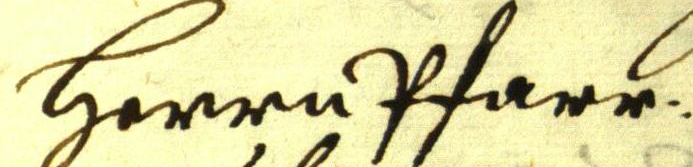Herrn Pfarr¬
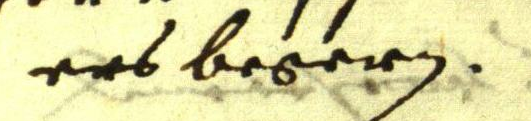ers begern.
